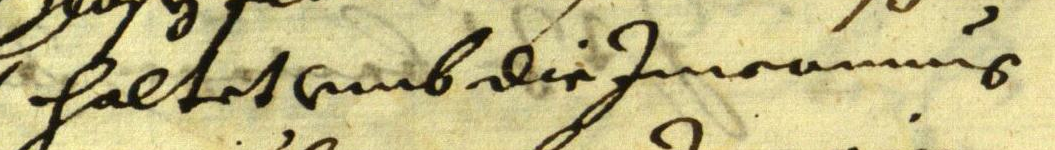haltet umb die Inwonnūng
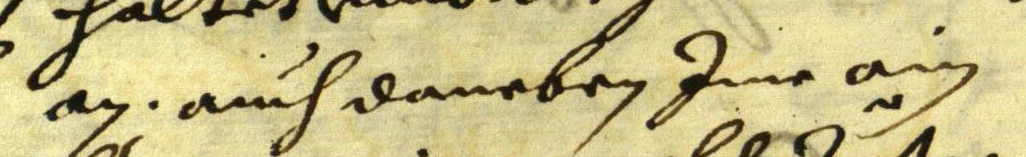an. aūch daneben Ime ain
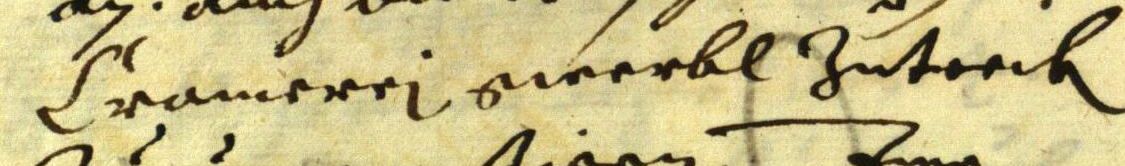Cramerej gwerbl Zūtreib
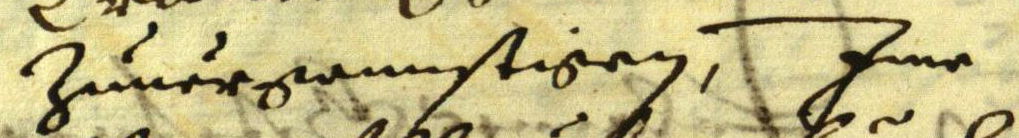Zūuērgonnstigen, Ime
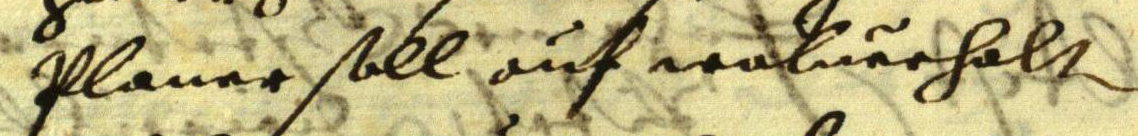Planer soll aūf woluērhalt
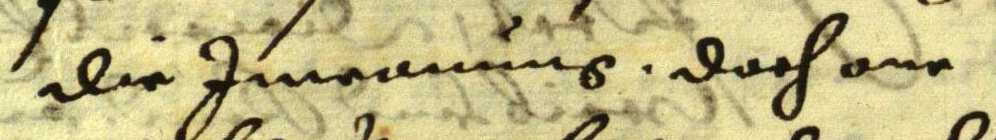die Inwonnūng. doch one
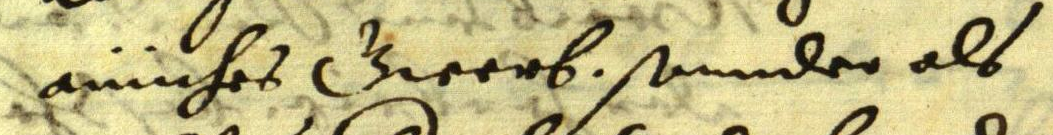ainiches Gwerb. sonnder als
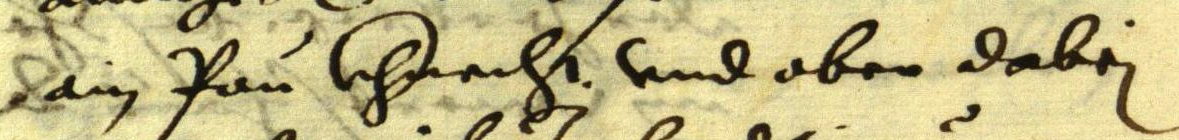ain Paū khnecht. vnd aber dabej
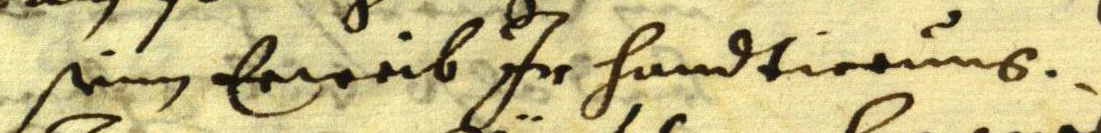sein Eeweib Ir handtierūng.
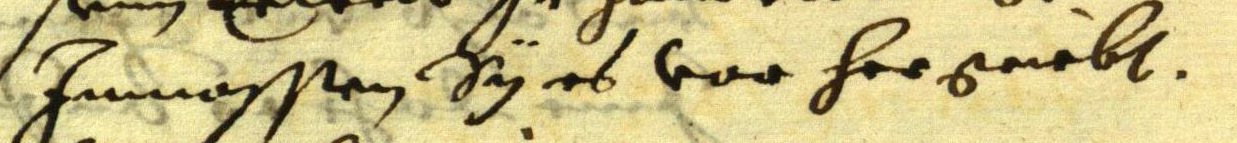Inmassen Sÿ es vor her geiebt.
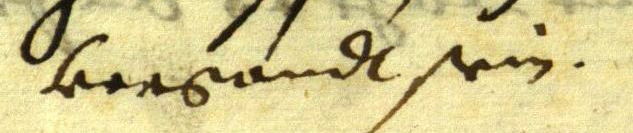vergondt sein.
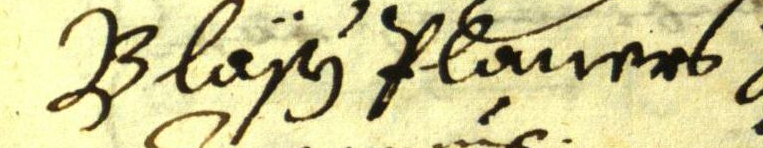Bläsȳ Planers
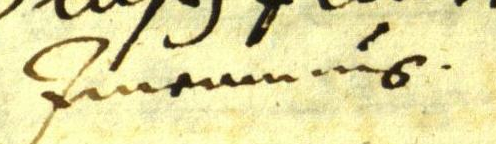Inwonnūng.
